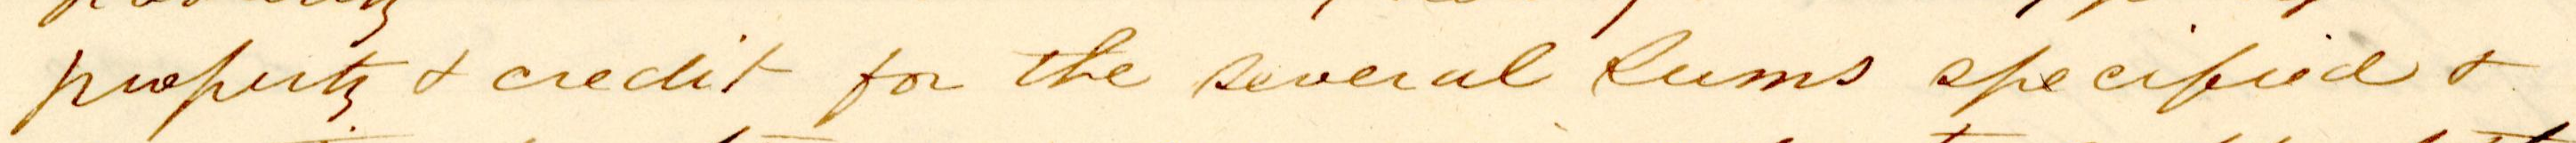property & credit for the several Sums specified &
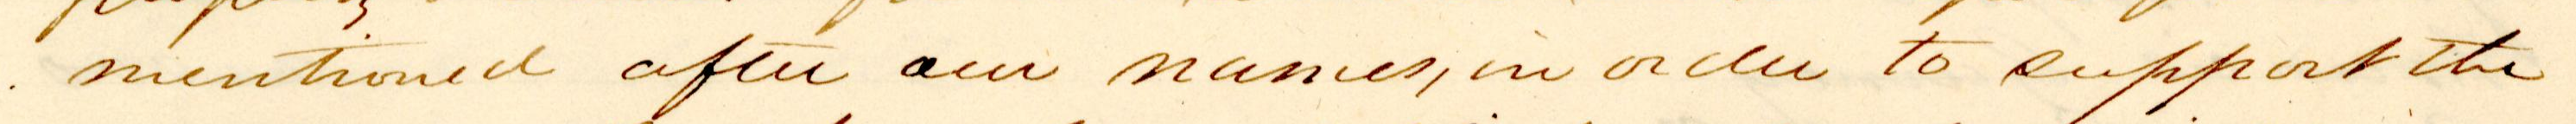mentioned after all names, in order to support the
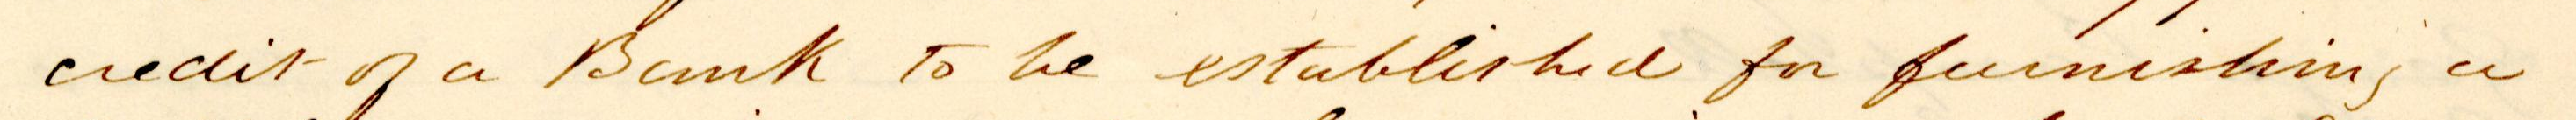credit of a Bank to be established for furnishing a
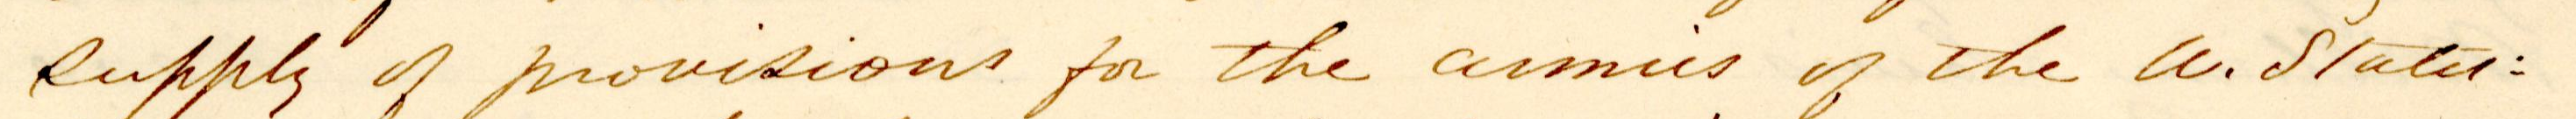supply of provisions for the armies of the U. States:
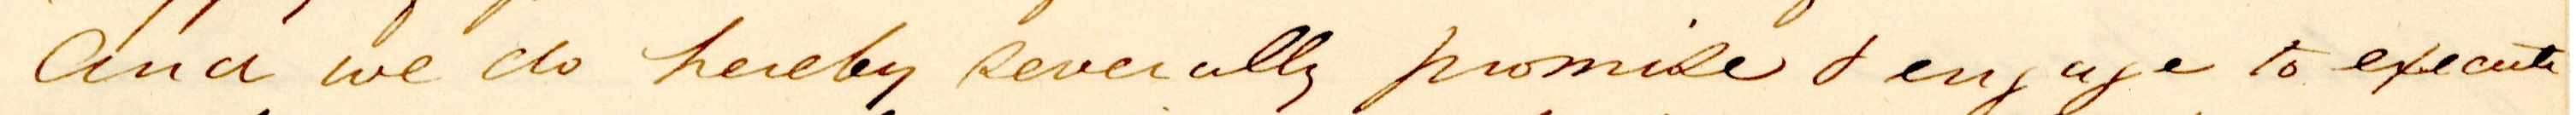And we do hereby severally promise & engage to execute
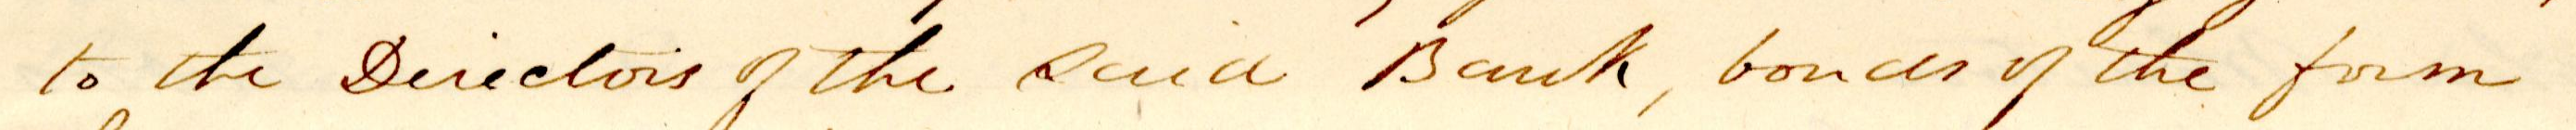to the Directors of the said Bank, bonds of the form
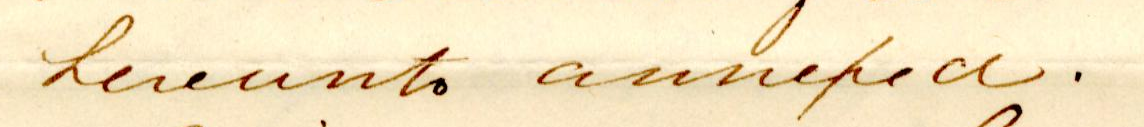hereunto annexed.
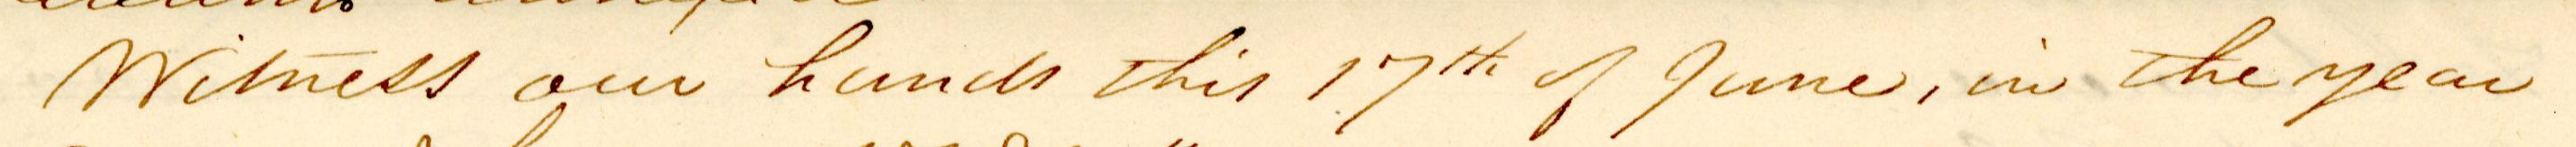Witness our hands this 17^t of June, in the year
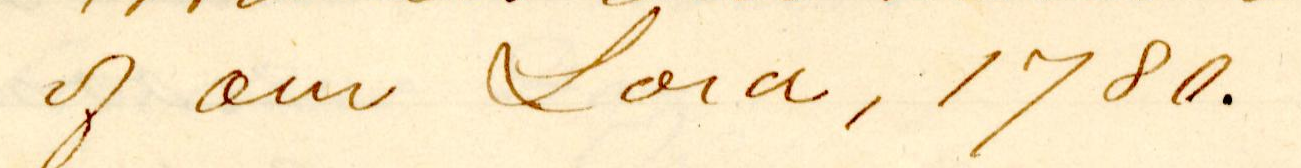of our Lord, 1780.
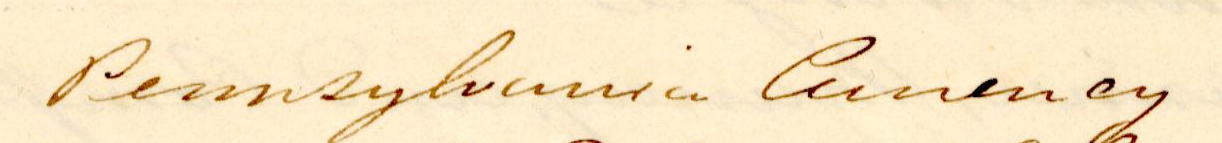Pennsylvania Currency
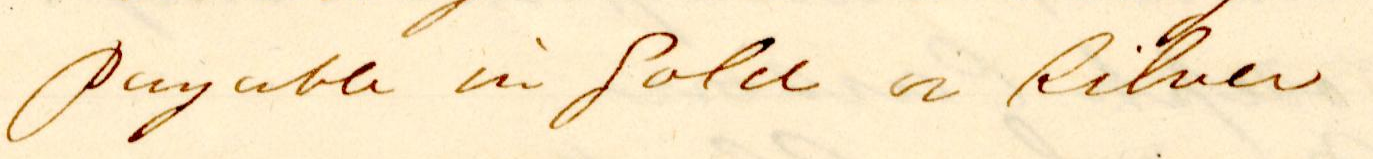payable in Gold or Silver
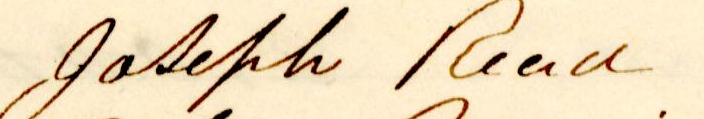Joseph Read
